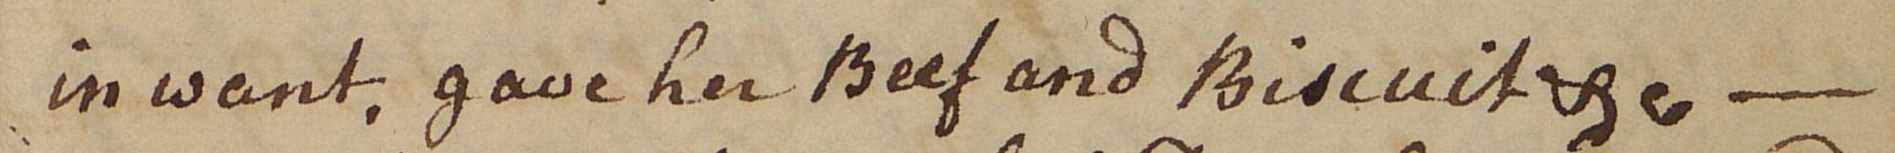in want, gave her Beef and Biscuit &c-
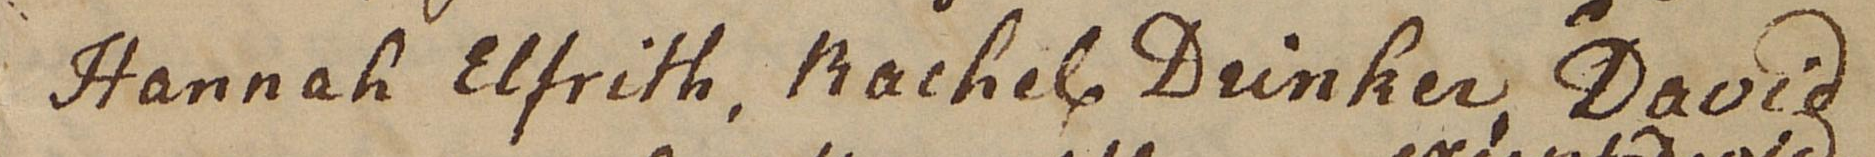Hannah Elfrith, Rachel Drinker, David
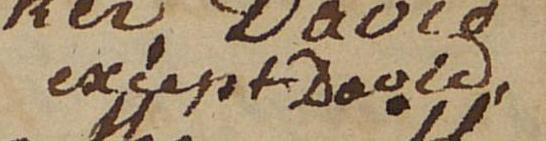except David,
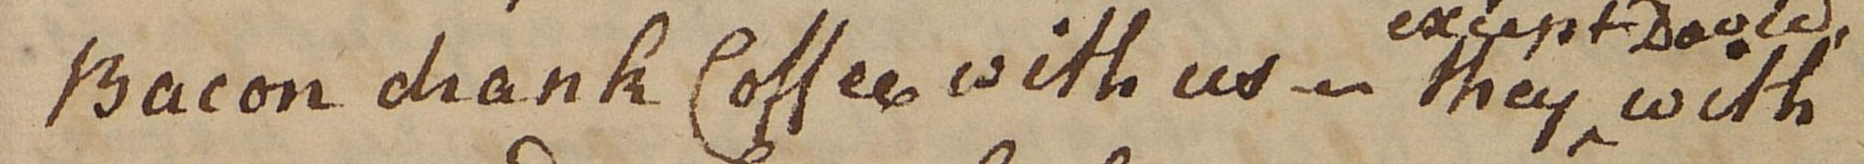Bacon drank Coffee with us- they ^ with
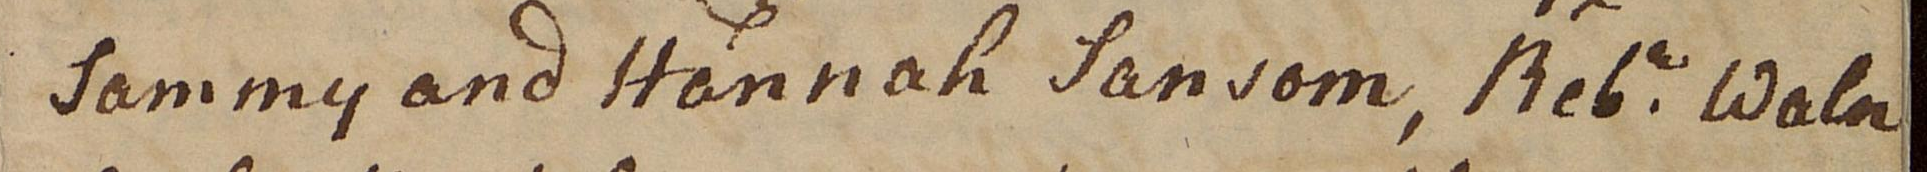Sammy and Hannah Sansom, Reb^a. Waln
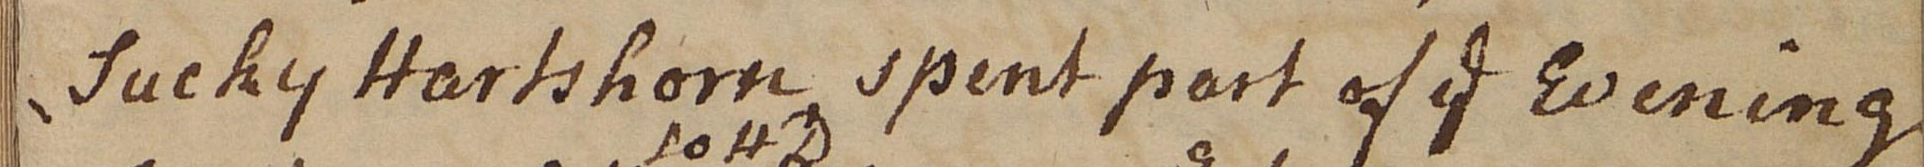Sucky Hartshorn, spent part of y^e Evening
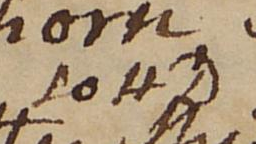to HD
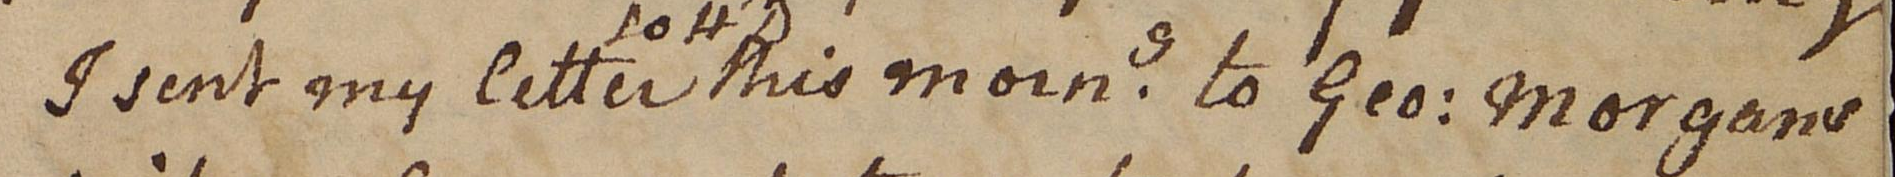I sent my letter this morn^g. to Geo: Morgans
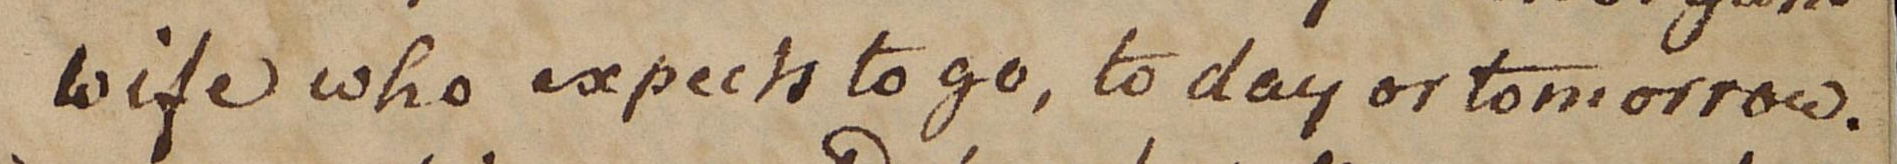Wife who expects to go, to day or tomorrow.
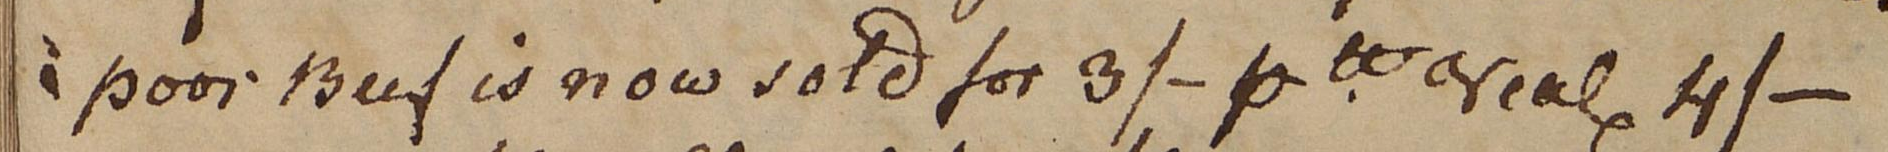poor Beef is now sold for 3s- p^lb. Veal 4s-
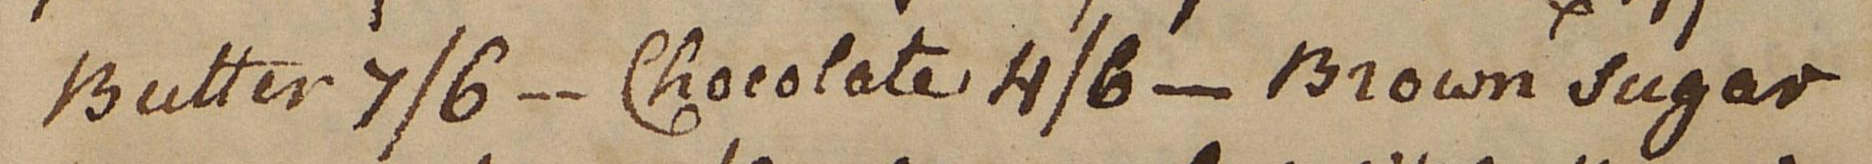Butter 7s6-- Chocolate 4s6- Brown Sugar
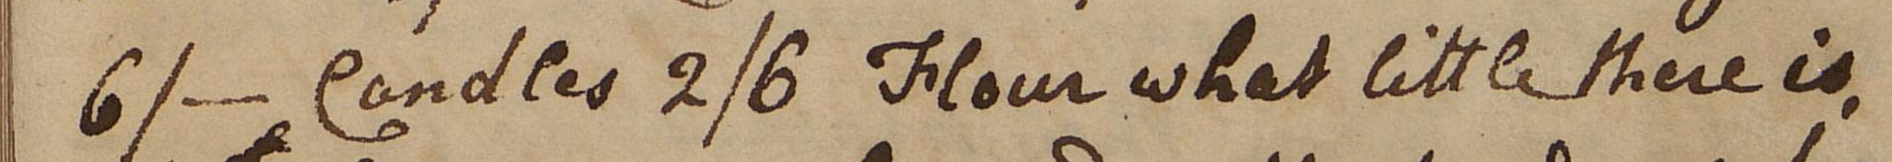6s- Candles 2s6 Flour what little there is,
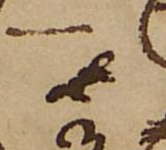£
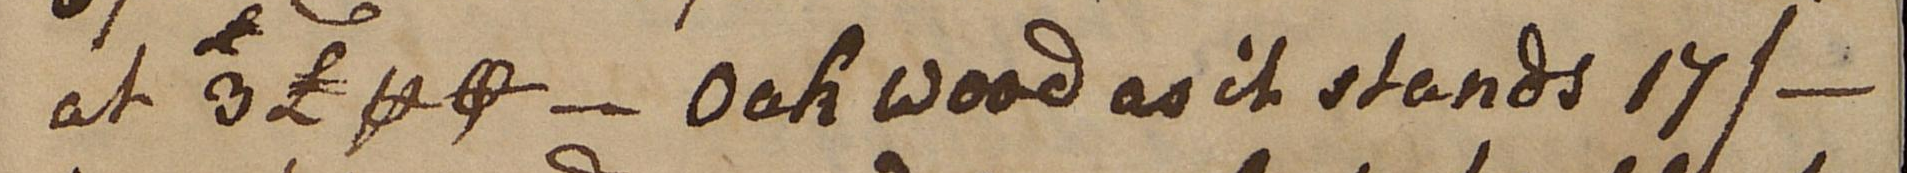at 3£ per lb- Oak Wood as it stands 17s-
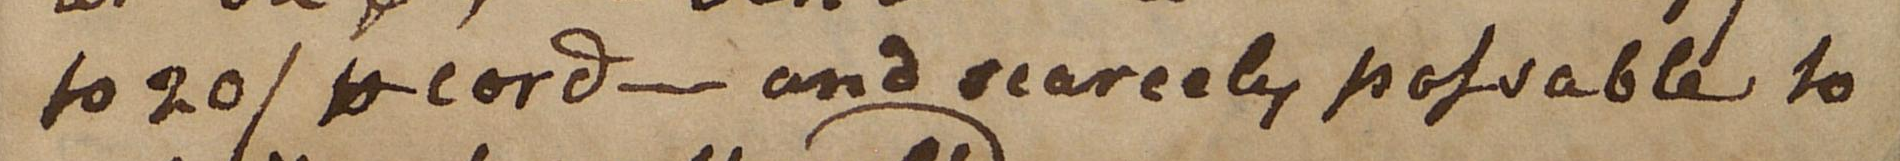to 20s per cord- and scarcely passable to
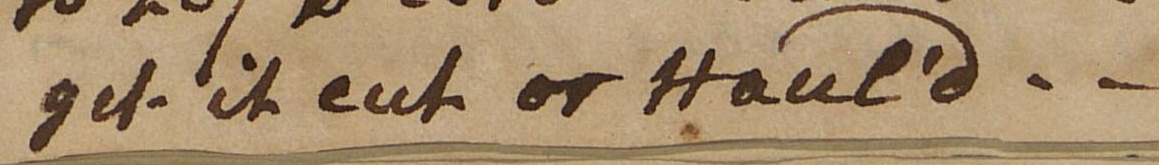get it cut or Haul'd.-
